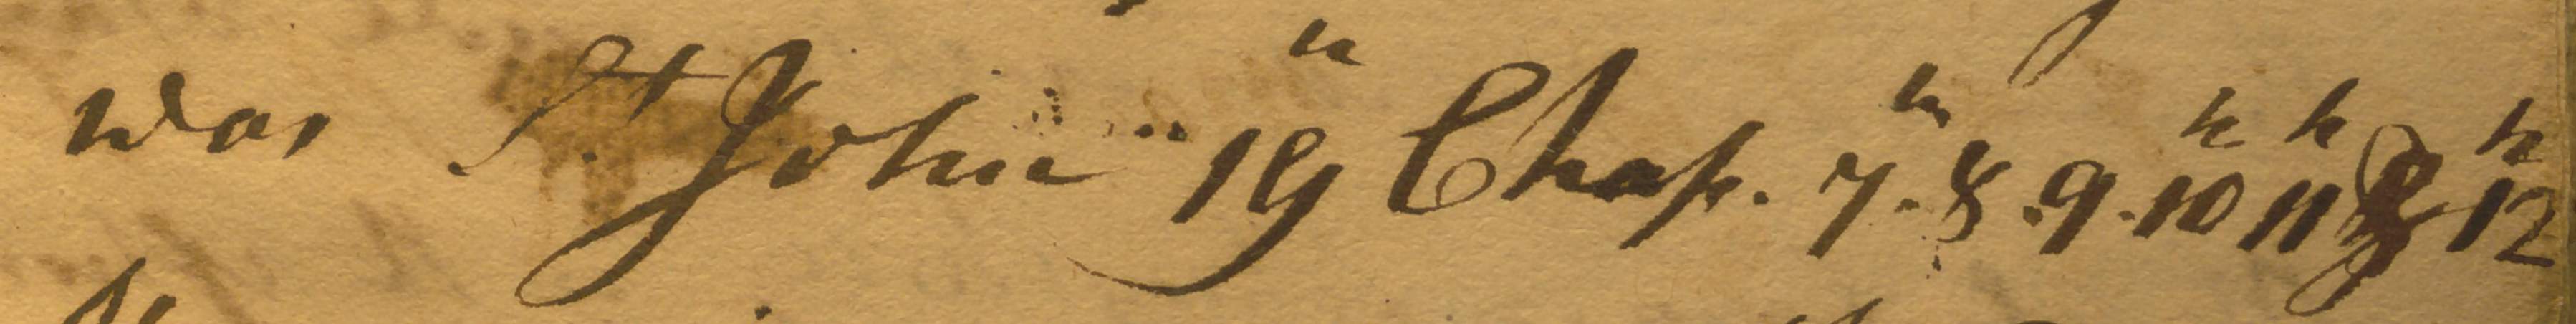was S^t. John 19^th Chap. 7^th. 8. 9. 10^th 11^th & 12^th
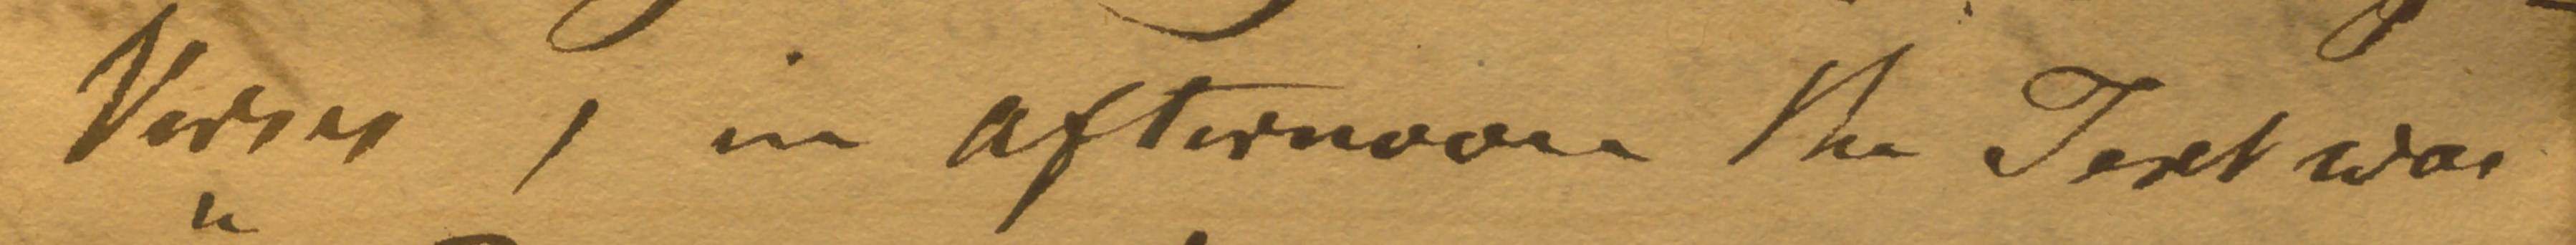Verses, in afternoon the Text was
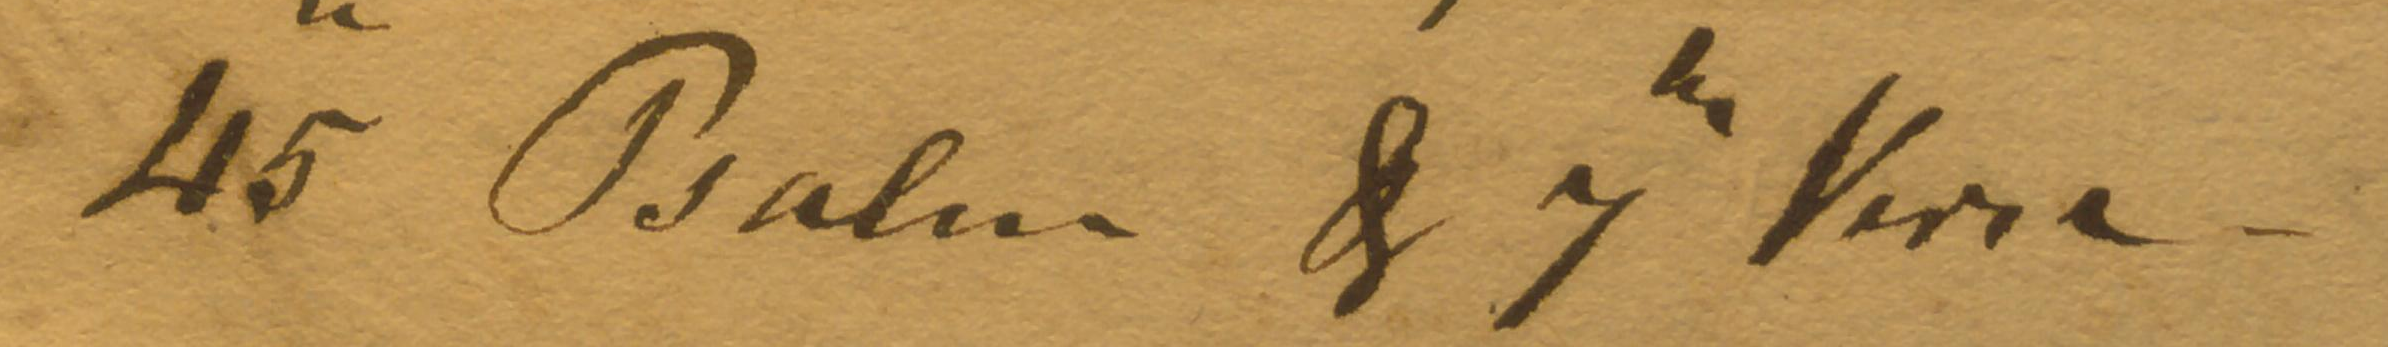45^h Psalm & 7^h Verse
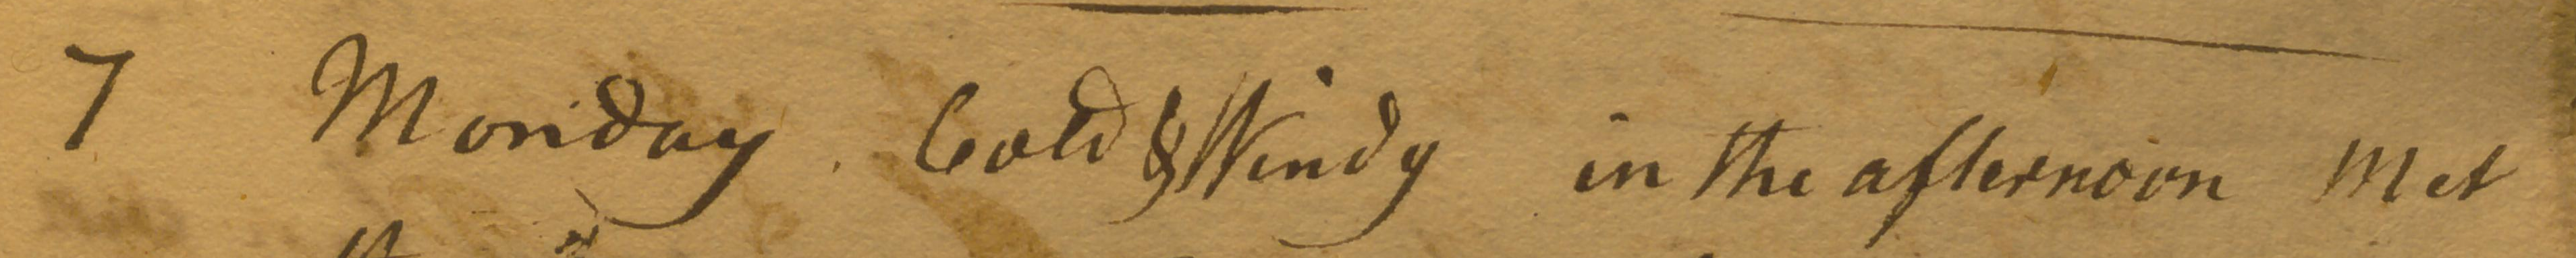7 Monday. Cold & Windy in the afternoon Met
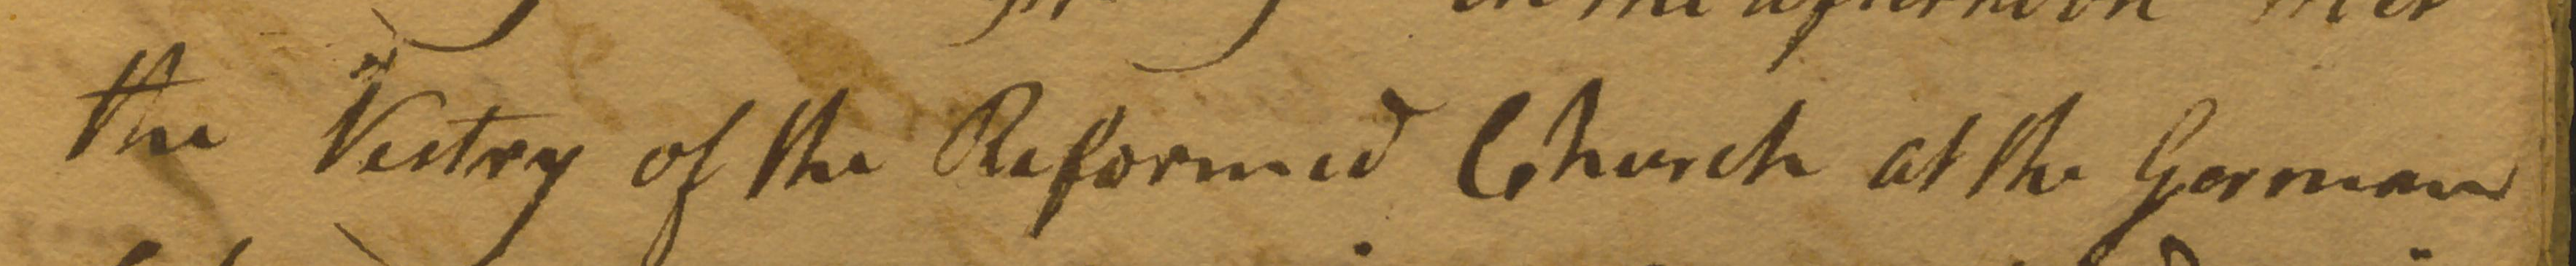the Vestry of the Reformed Church at the German
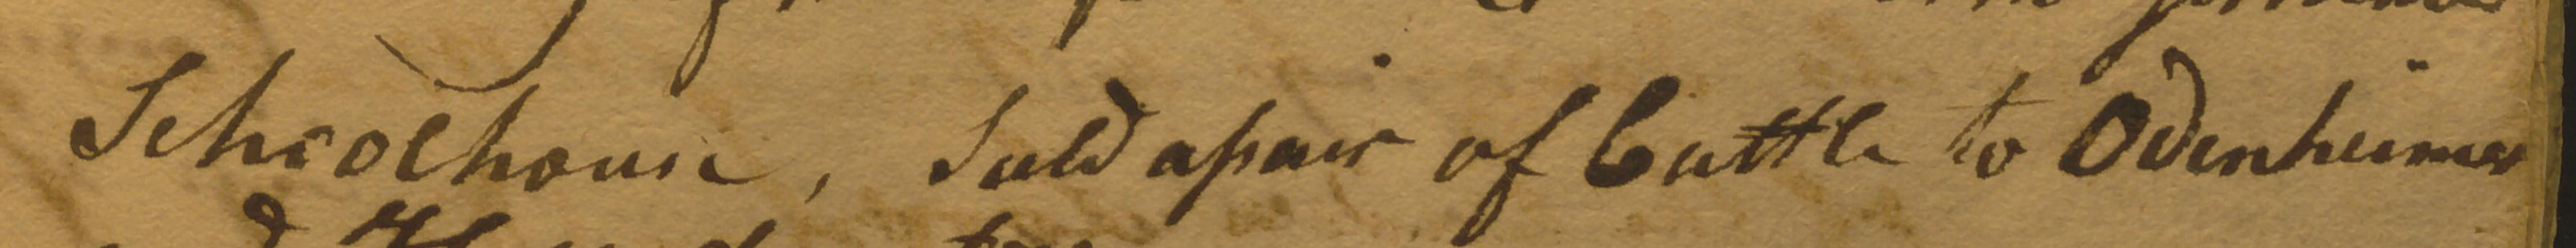Schoolhouse, sold a pair of Cattle to Odenheimer
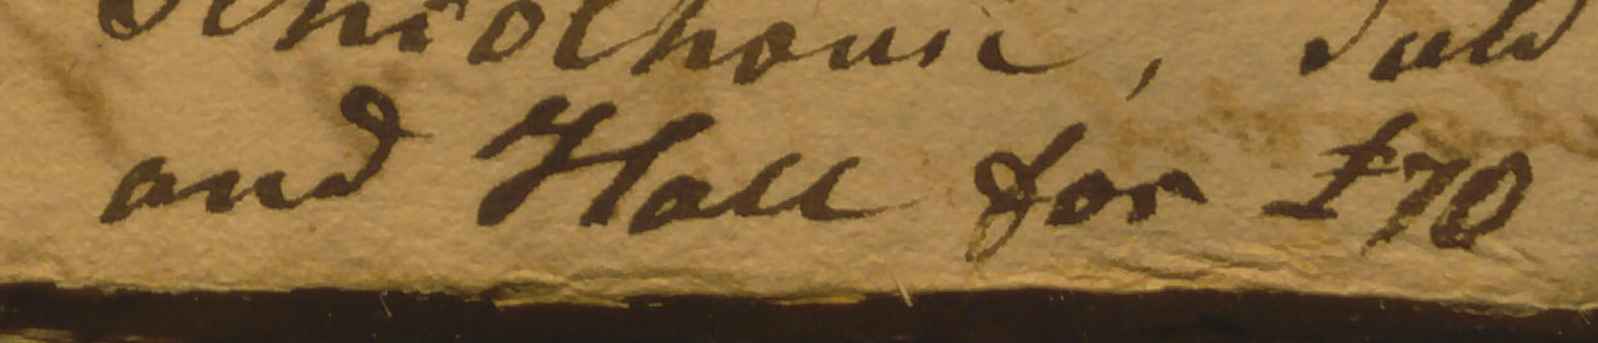and Hall for £70
